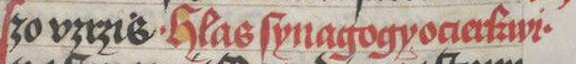zo vzrziṡ.Hlas ſynagogyocierwi.
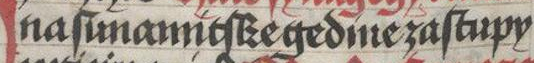na ſunamitſke gedine zaſtupy
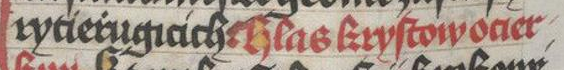ritieṙugicích?Hlas kryſtow ocier¬
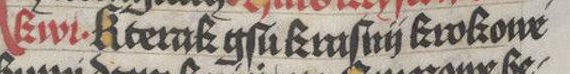kwi Kterak gſu kraſnij krokowé
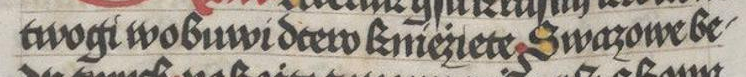twogi wobuwi dcero knieżiete.Swazowe be¬
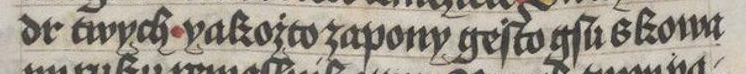dr twych.yakożto zapony geẛto gſu skowa¬
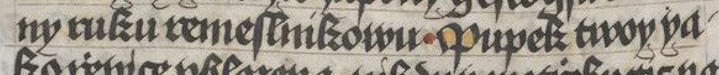ny ruku remeſlníkowu.Pupek twoy ya¬
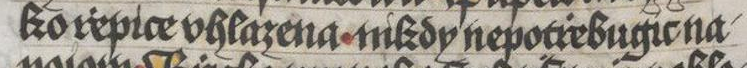ko ṙepice vhlazena.nikdy nepotṙebugic na¬
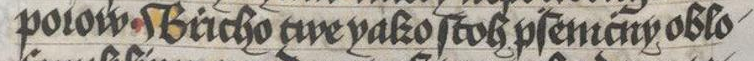poiow.Bṙicho twe yako ſtoh pẛeniċny oblo¬
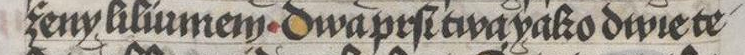żeny liliumem.Dwa prſi twa yako dwie te¬
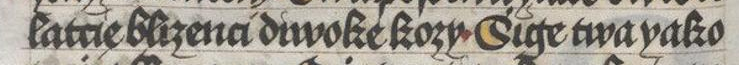latcie blizencí diwoke kozy.Ṡige twa yako
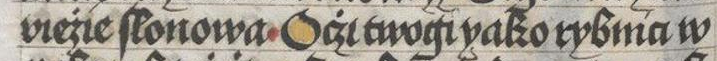vieżíe ſlonowa.Ocżi twogi yako rybníci w
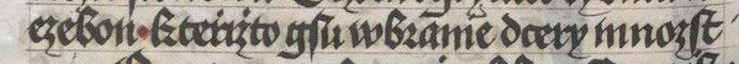ezebon. kteṙižto gſu wbranie dcery mnozſt¬
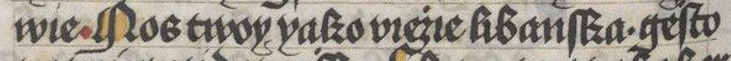wieNos twoy yako vieżie libanſka.geẛto
